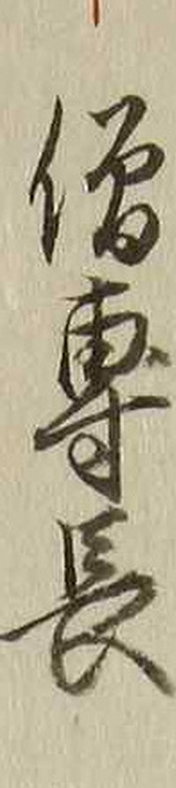僧専長
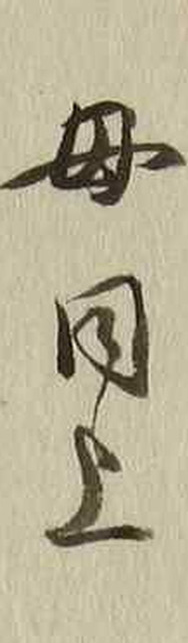母同上
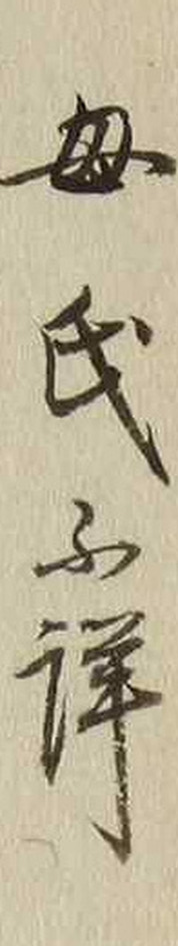母氏ふ詳
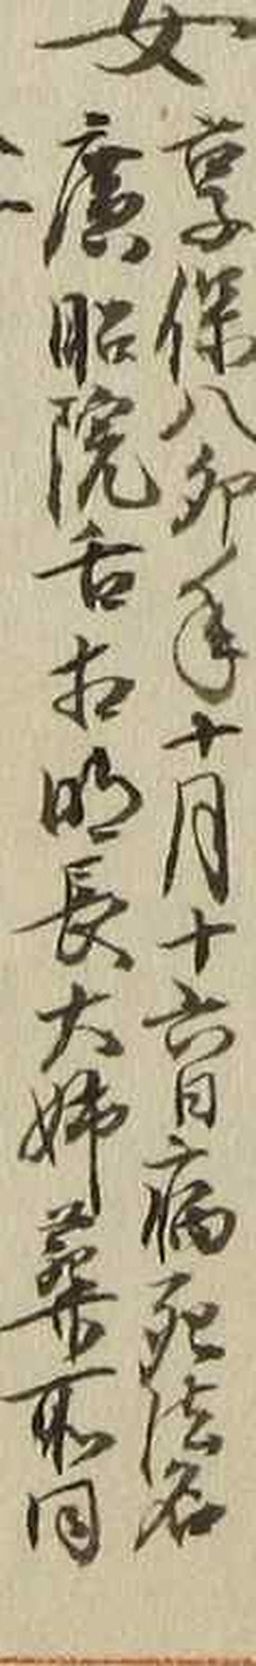広昭院舌相明長大姉葬所同
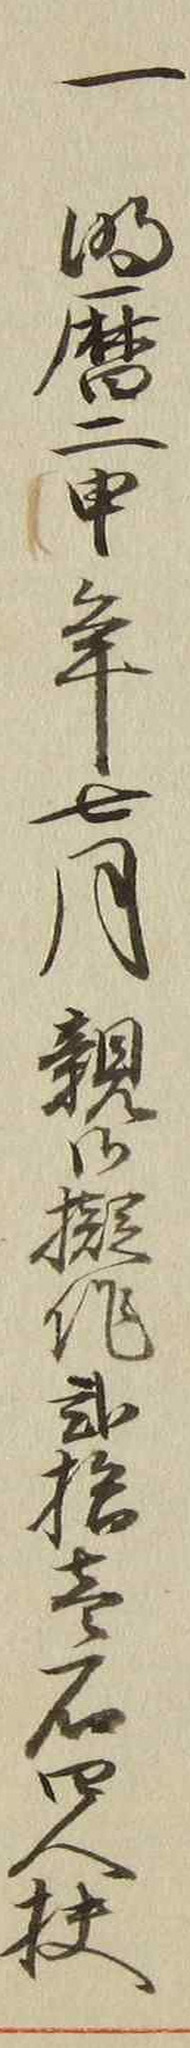一明暦二申年七月親御擬作弐拾壱石四人扶
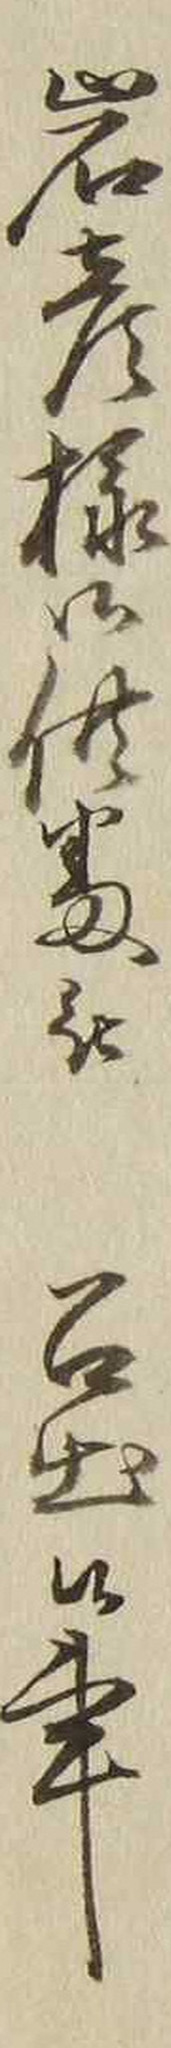岩彦様御供番被召出候事
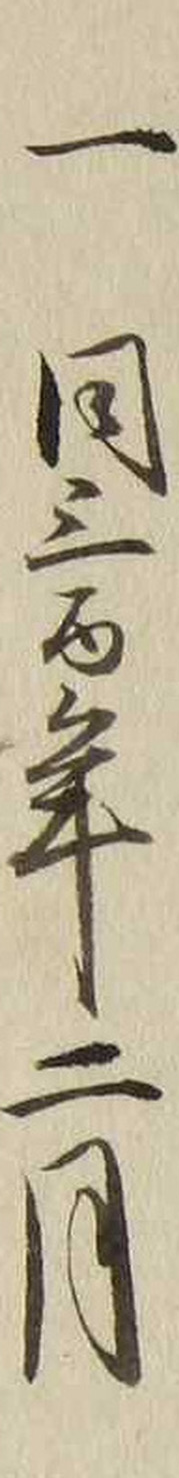一同三酉年二月
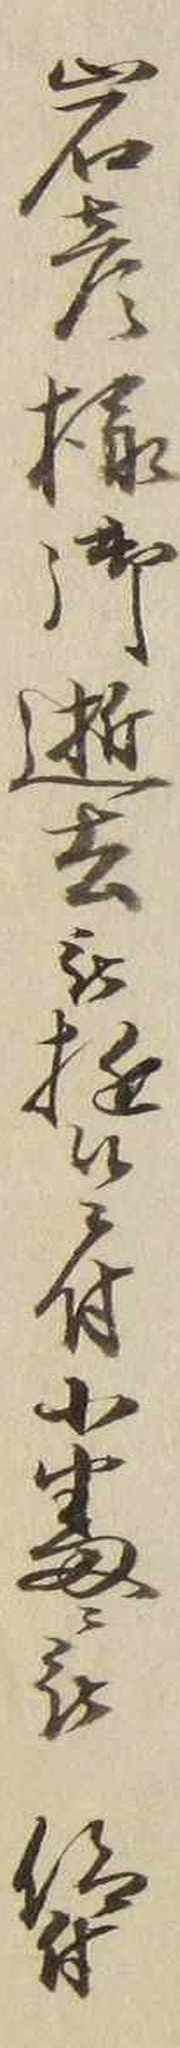岩彦様御逝去被遊候ニ付小番二被仰付

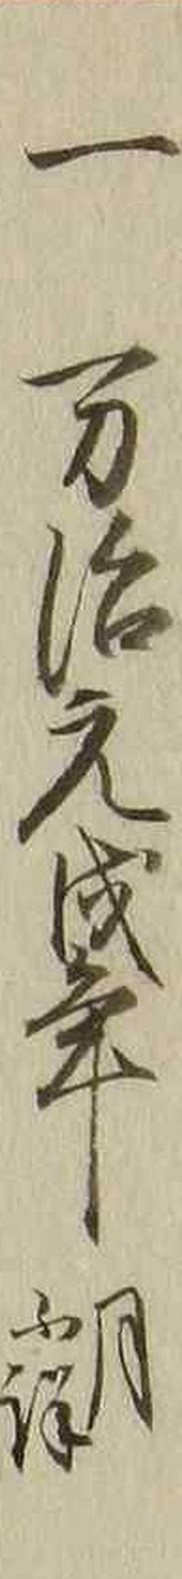一万治元戌年月ふ詳
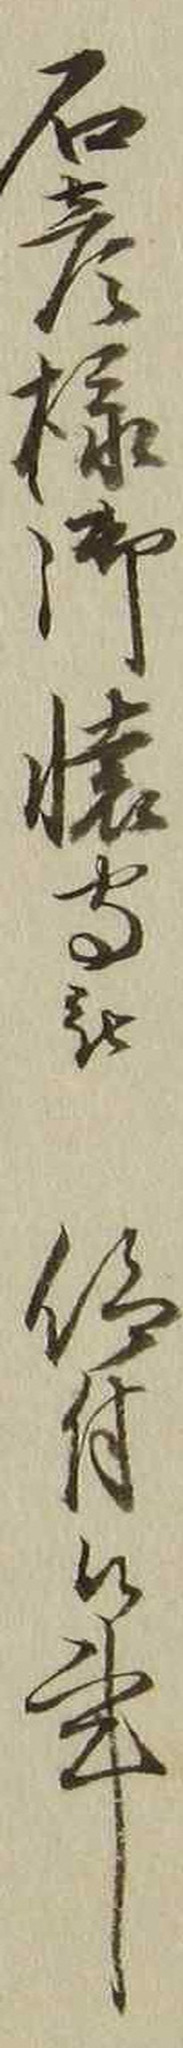石彦様御懷守被仰付候事
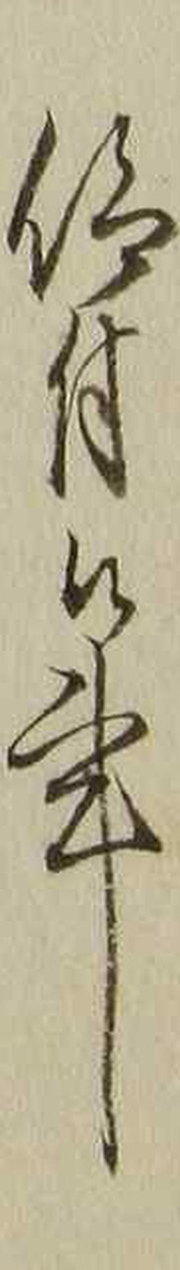仰付候事
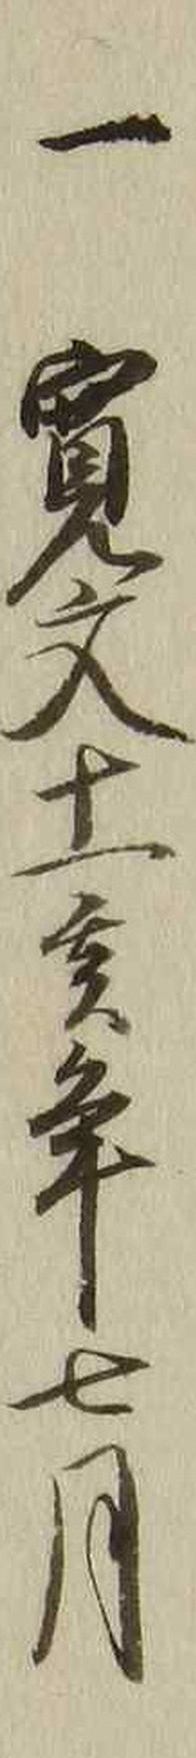一寛文十一亥年七月
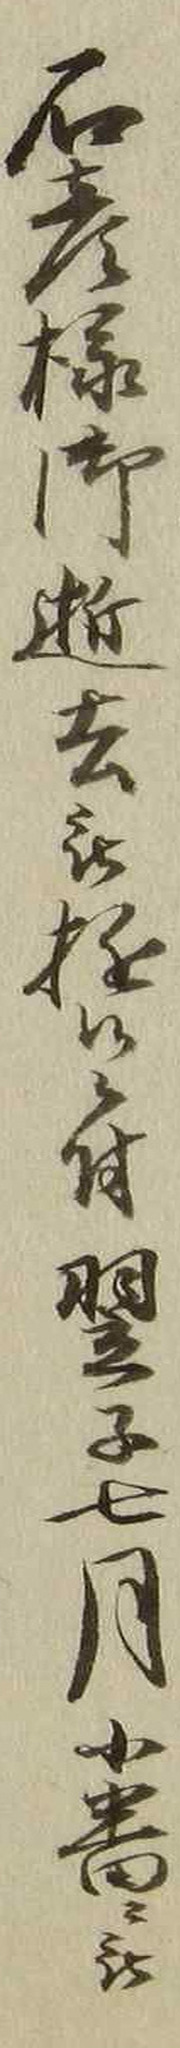石彦様御逝去被遊候ニ付翌子七月小番二被
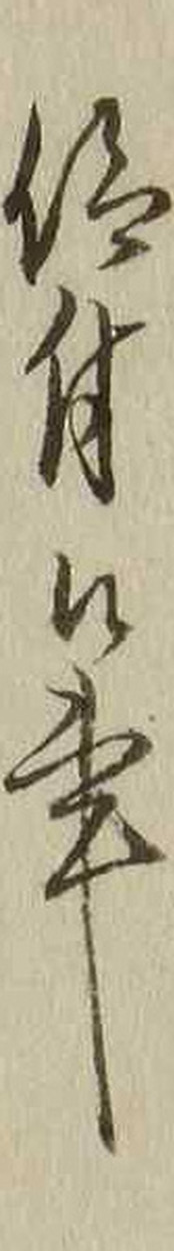仰付候事
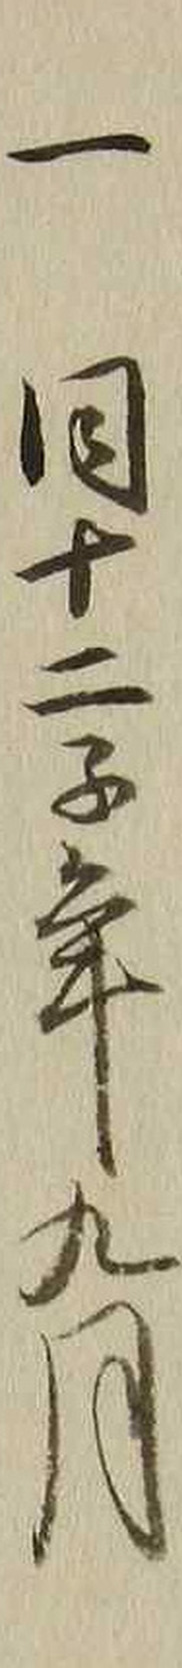一同十二子年九月
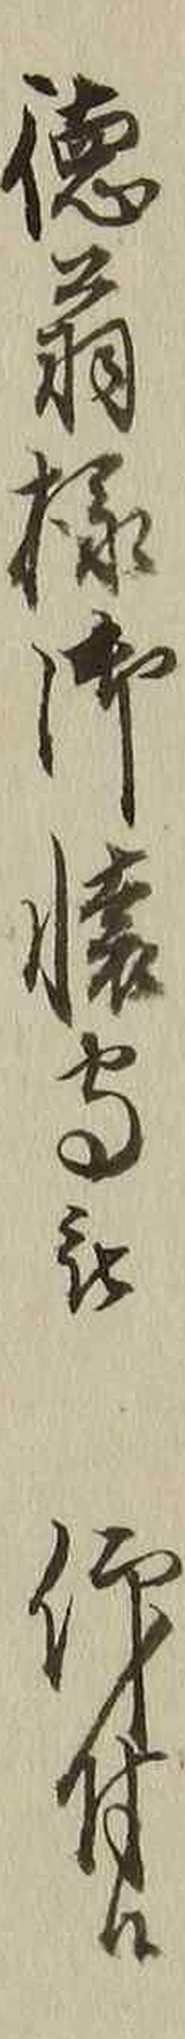徳翁様御懐守被仰付候
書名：諸士系譜　巻之114　か之部22
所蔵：会津若松市立会津図書館
